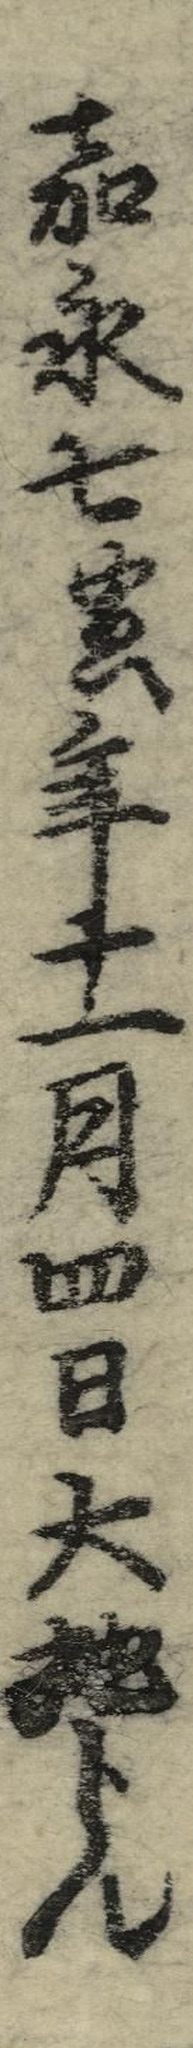嘉永七寅年十一月四日大地しん
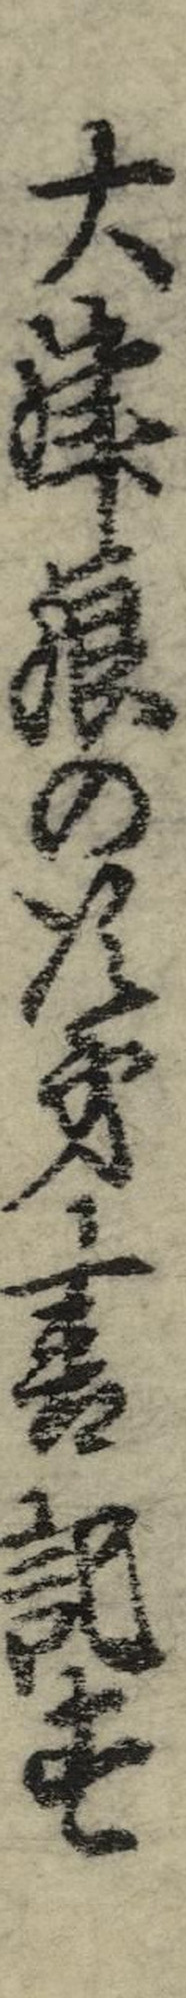大津浪の次第書記す
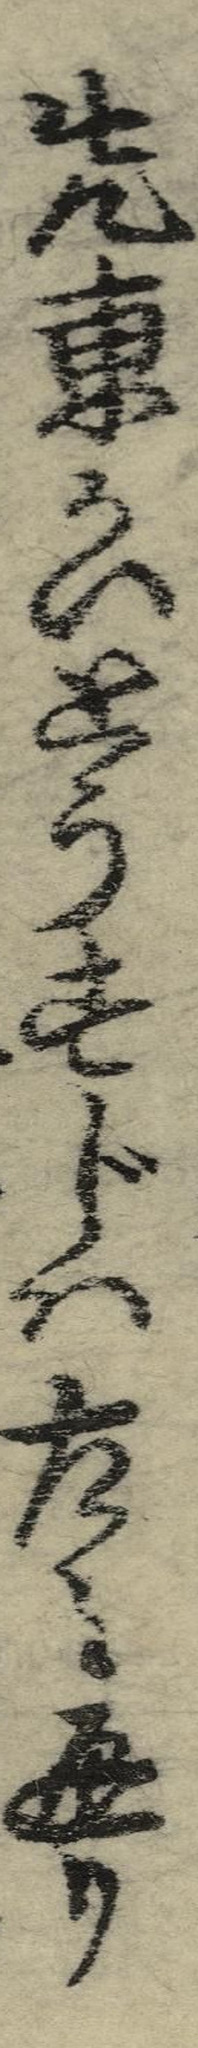先東かいとうすじは左之通り
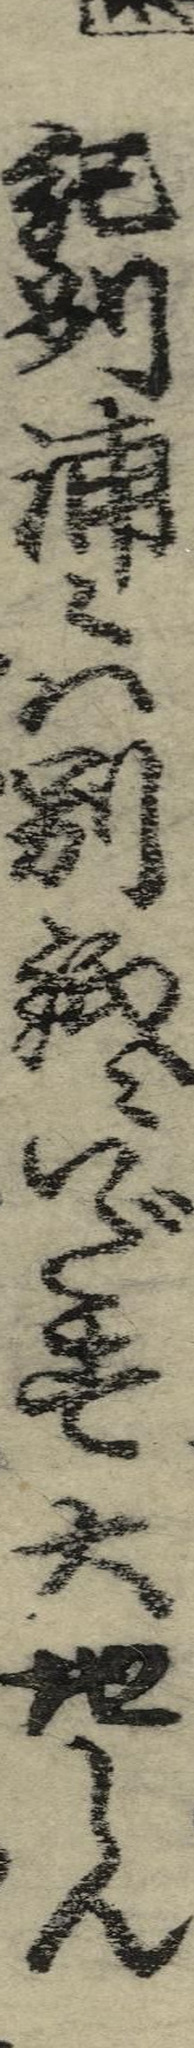紀州浦〻は別紙ニいだす大地しん
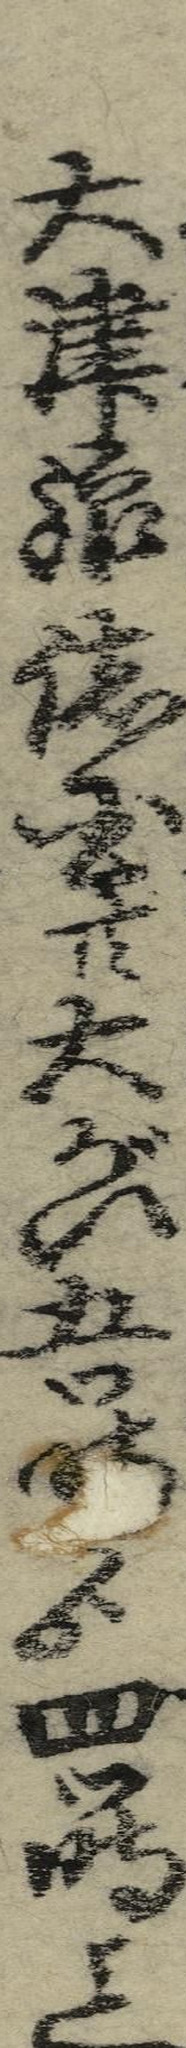大津浪諸国共大がい五ッ時ゟ四ッ時迄
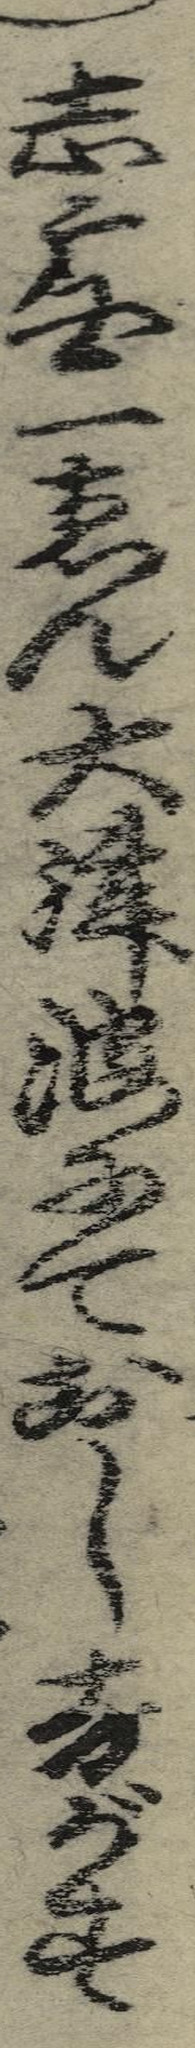志摩国一ゑん大津浪にておしながす
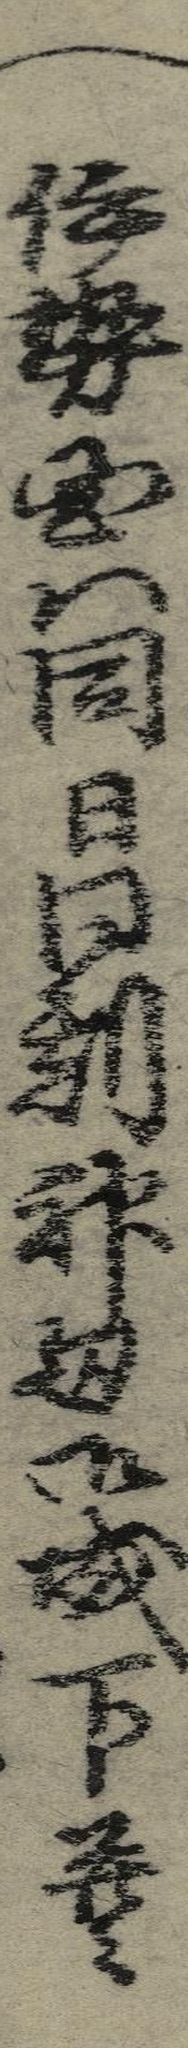伊勢国は同日同刻神辺御城下并ニ
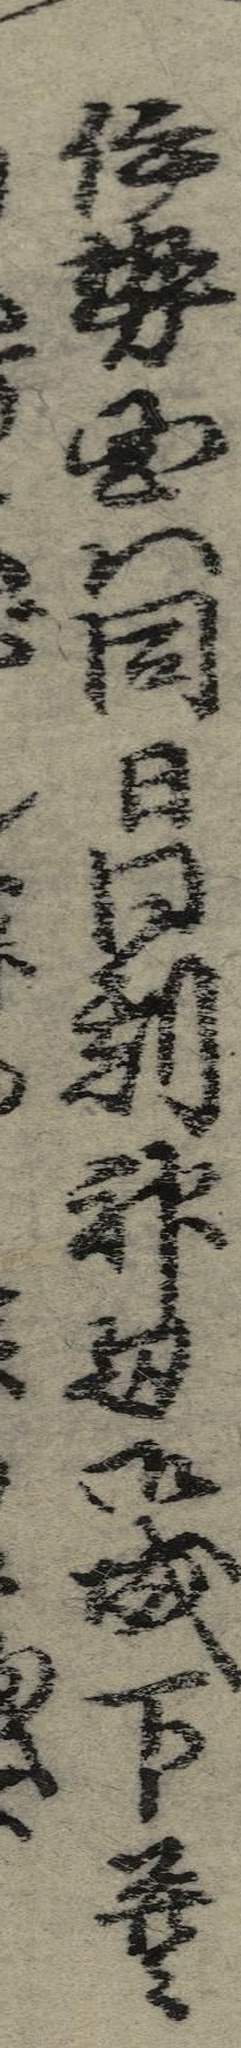伊勢国は同日同刻神辺御城下并ニ
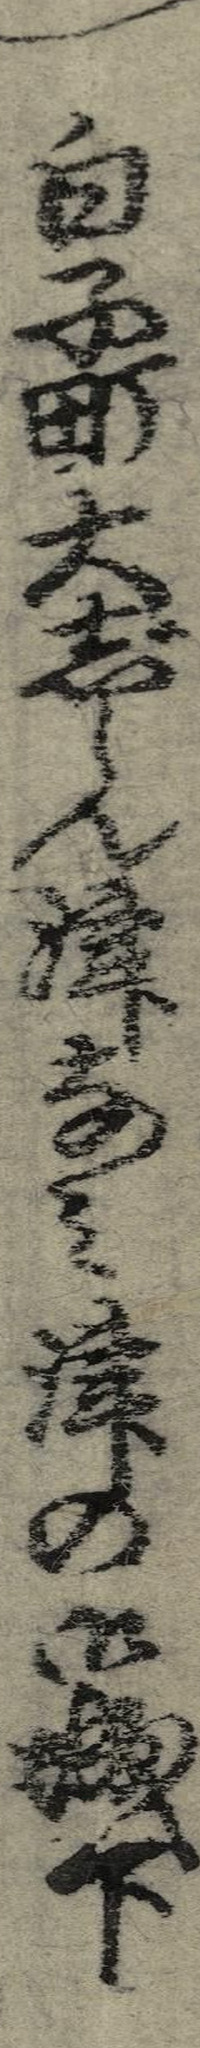白子町大じしん津なみ津の御城下
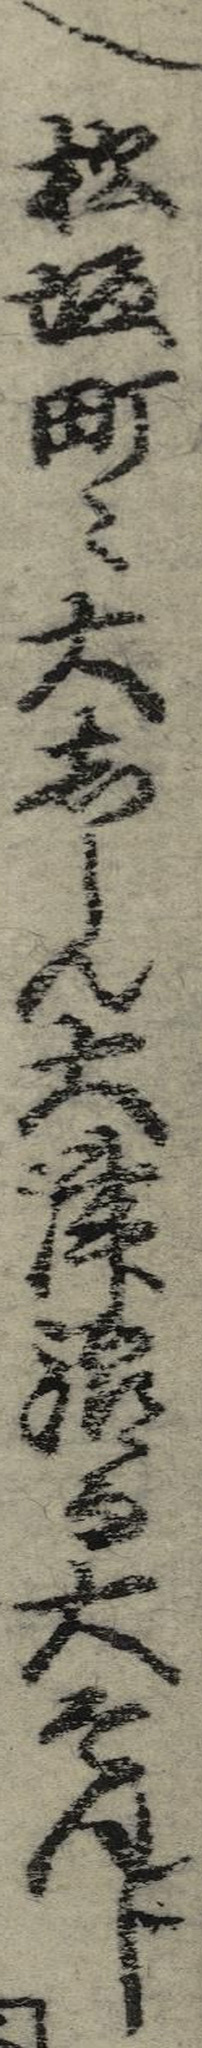松坂町〻大ししん大津浪ニ而大そんじ
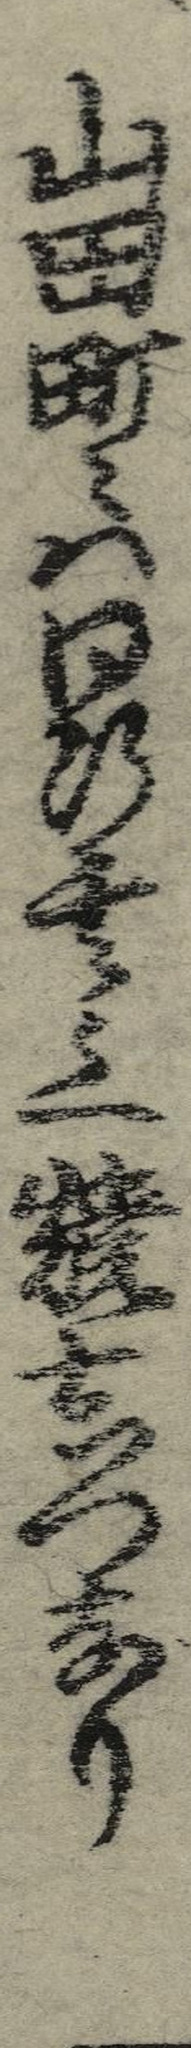山田町ニハ同断其上焼しつなり
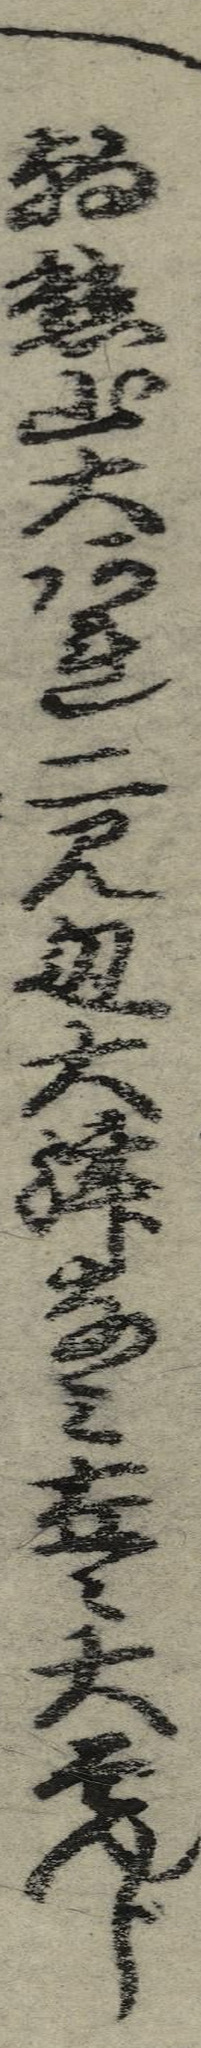朝熊山大あれ二見辺大津なミ在々大そんじ
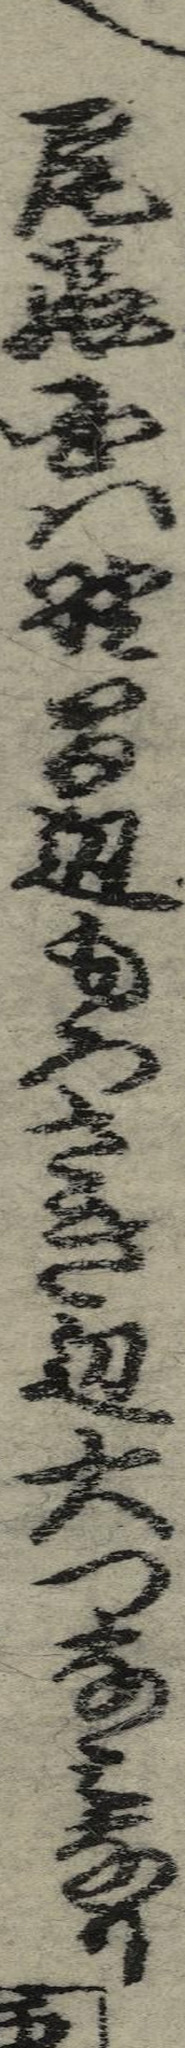尾張国ハ野間辺もろさき辺大つなミなり
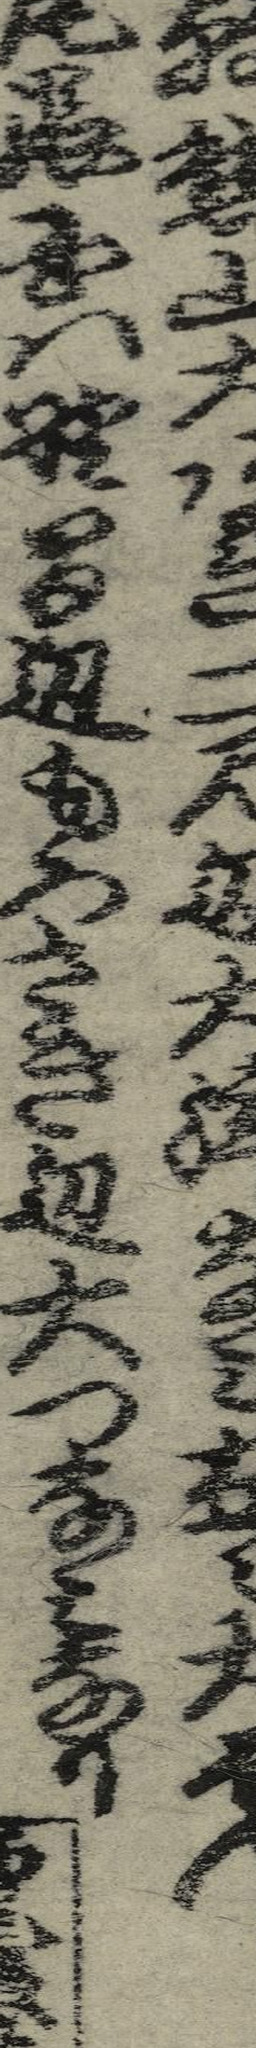尾張国ハ野間辺もろさき辺大つなミなり
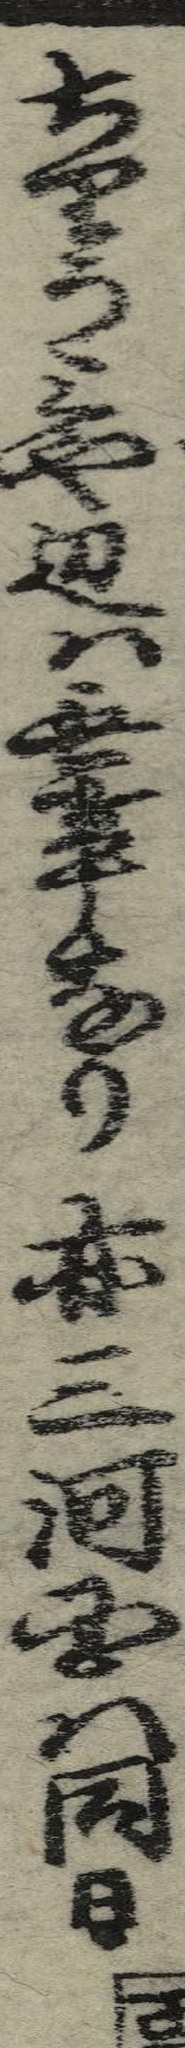ちりうミや辺ハ無事なり又三河国ハ同日
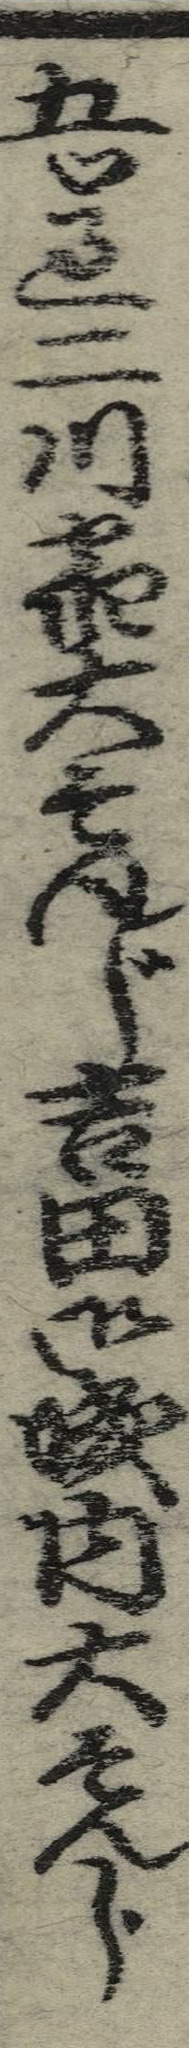五ッ過二川宿大そんじ吉田御城内大そんじ
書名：諸國大地震并大津浪
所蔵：東京大学地震研究所図書室 Earthquake Research Institute Library, The University of Tokyo, JAPAN
